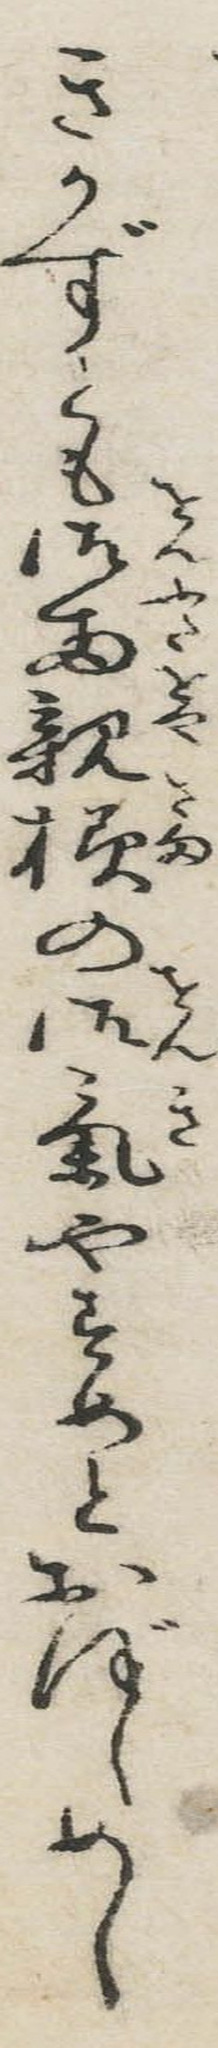きかずとも御両親様の御気やすめとおぼしめし
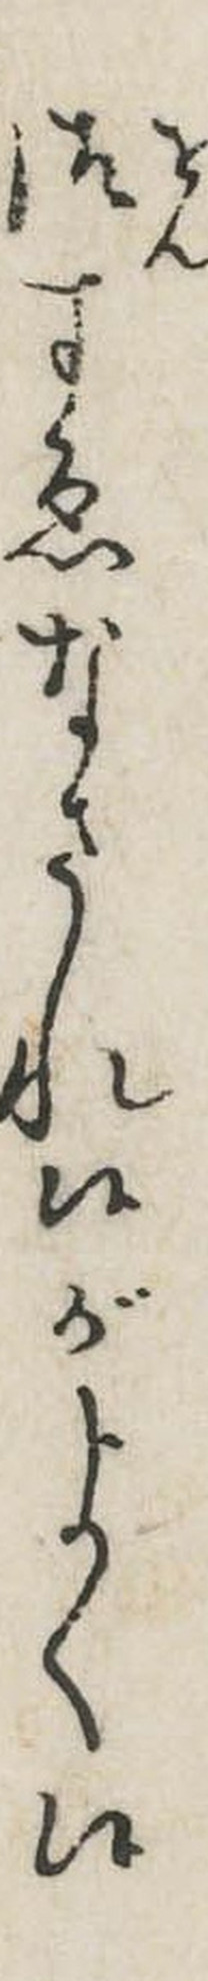御すゑなされ候がよく候
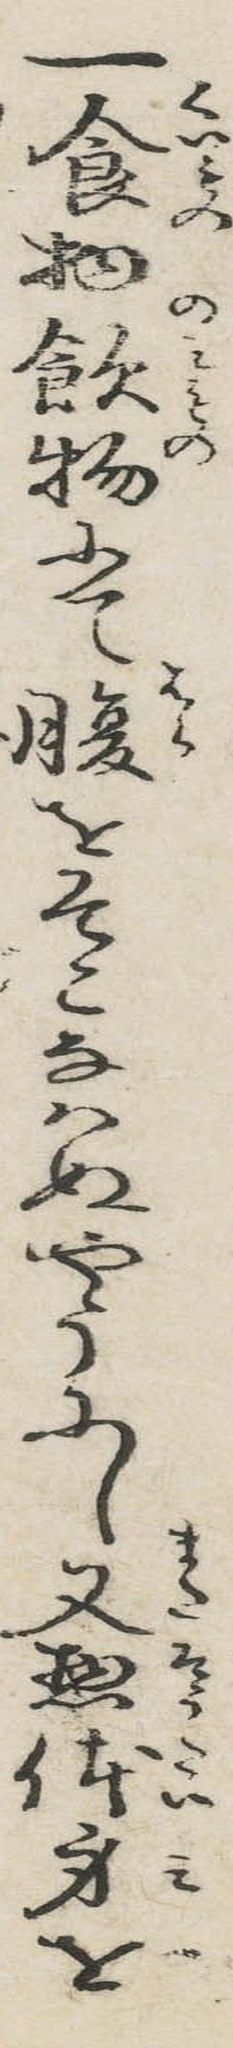一食物飲物にて腹をそこなはぬやうにし又惣体身を
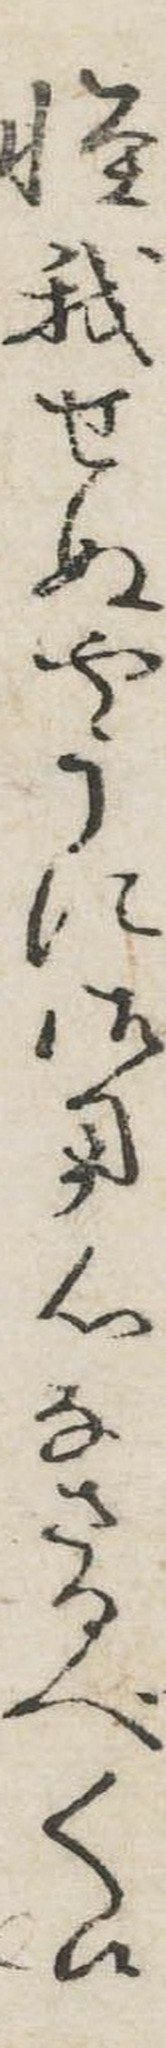怪我せぬやうに御用心ななさるべく候
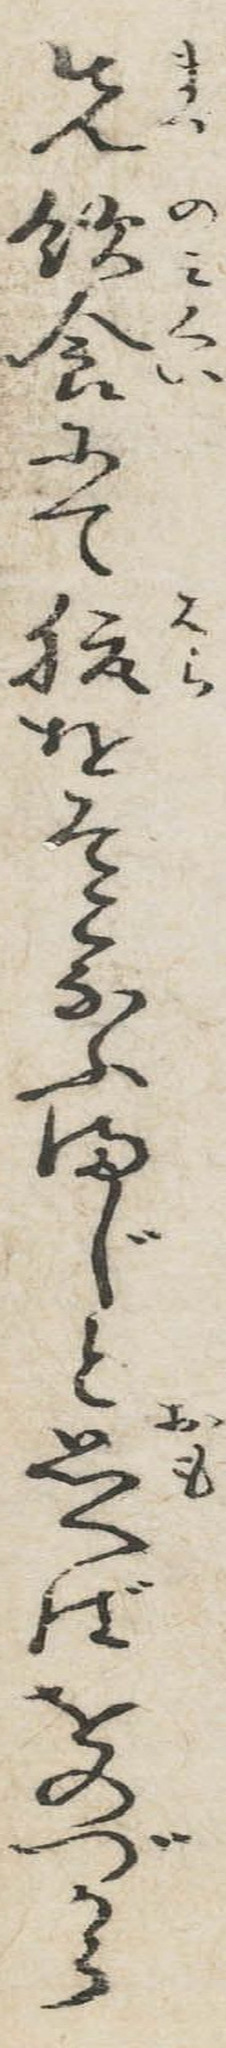先飲食にて腹をそこなふまじと思へばをのづから
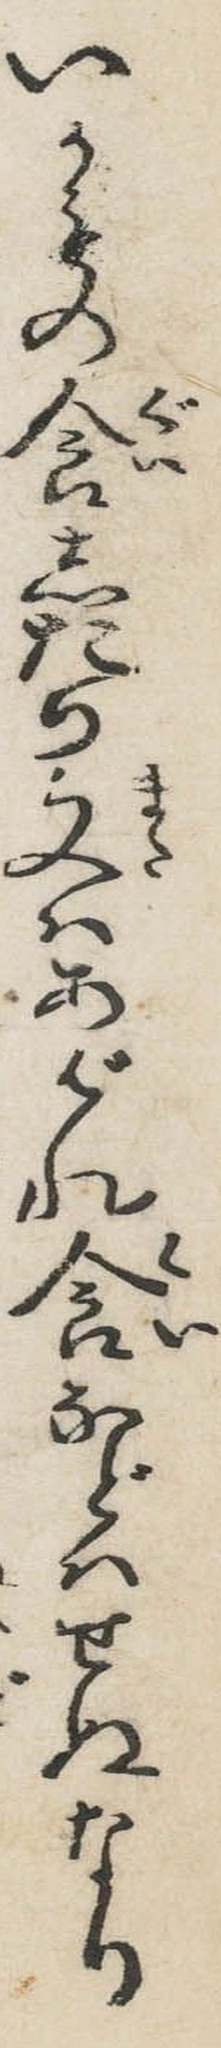いかもの食したり又はあばれ食などはせぬなり
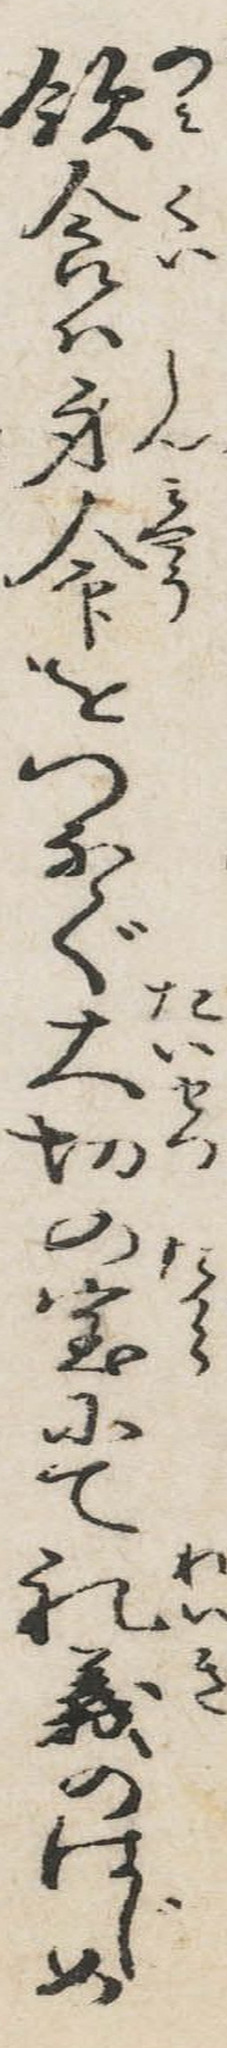飲食は身命をつなぐ大切の宝にて礼義のはじめ
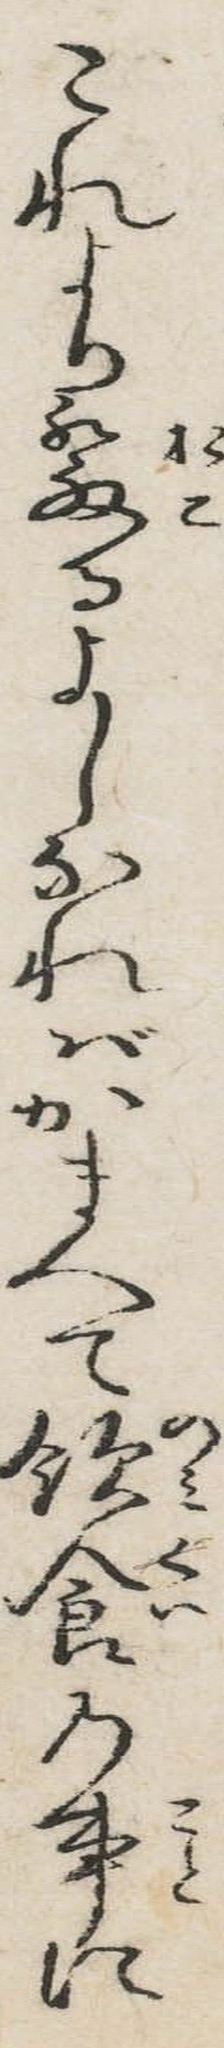これより発るよしなればかまへて飲食の事に
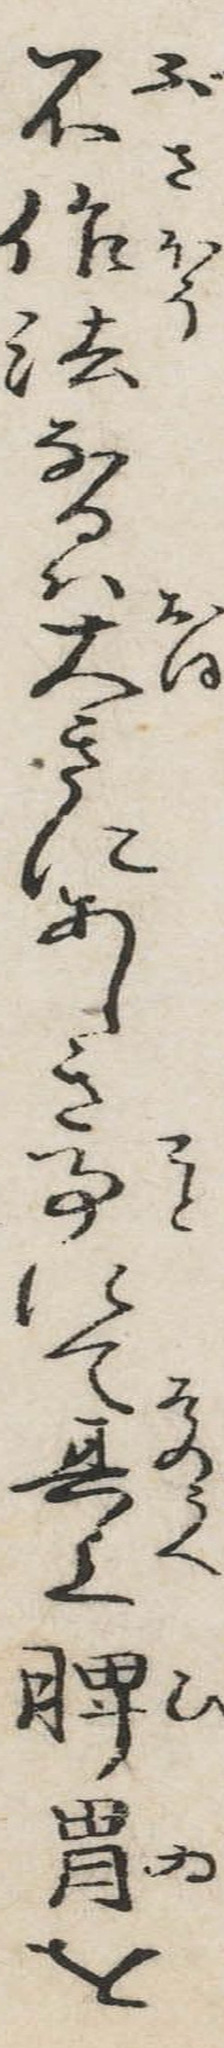不作法なるは大きにあしき事にて其上脾胃を
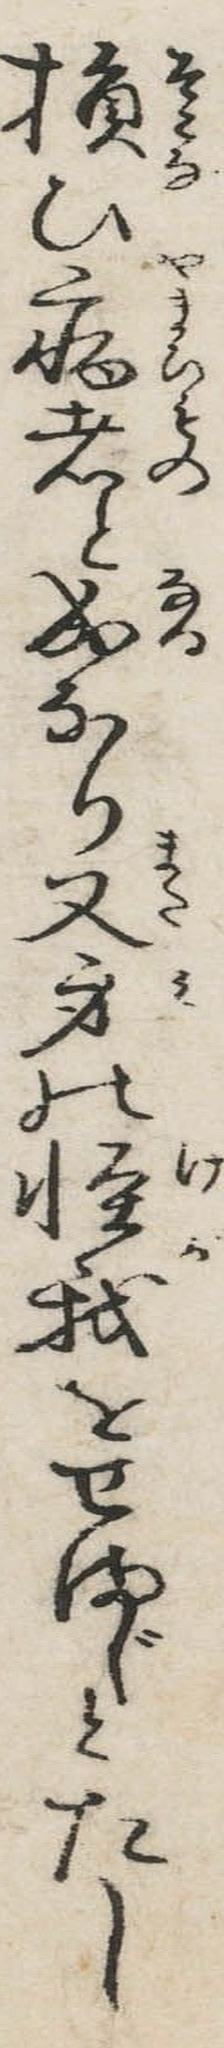損ひ病者と成なり又身の怪我をせまじとたし
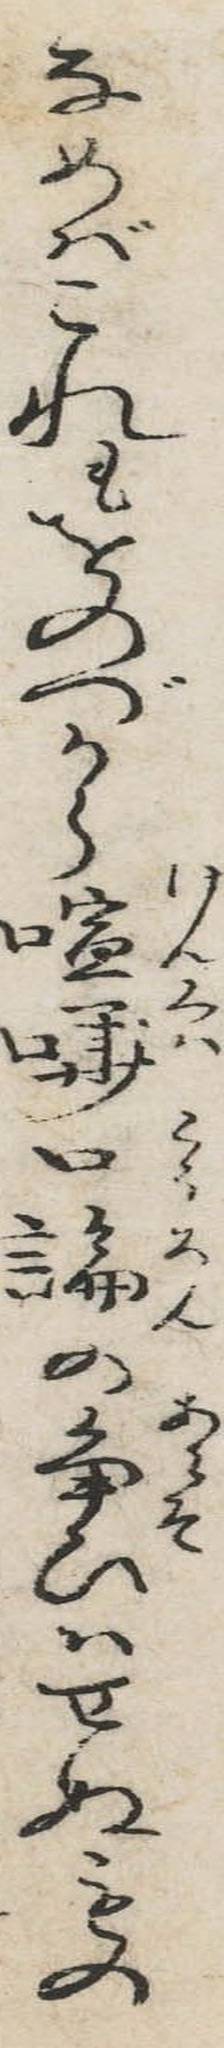なめばこれもをのづから喧嘩口論の争ひはせぬもの
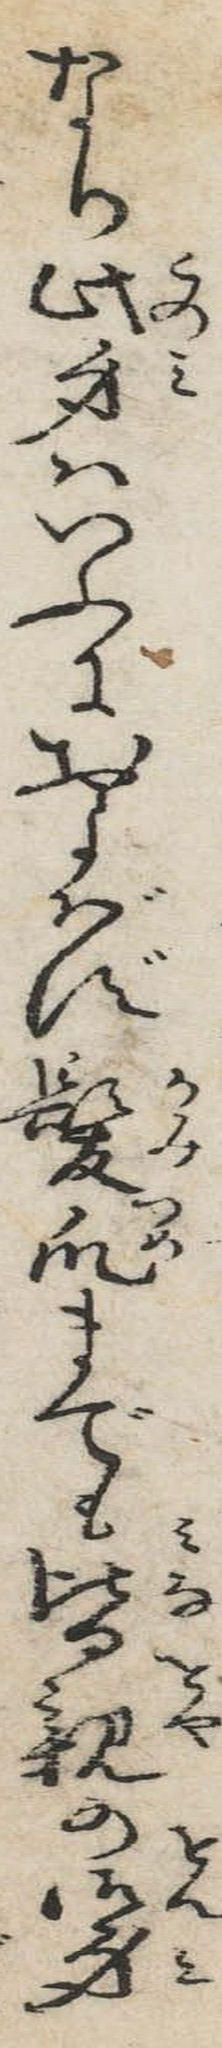なり此身はいふにおよばず髪爪までも皆親の御身
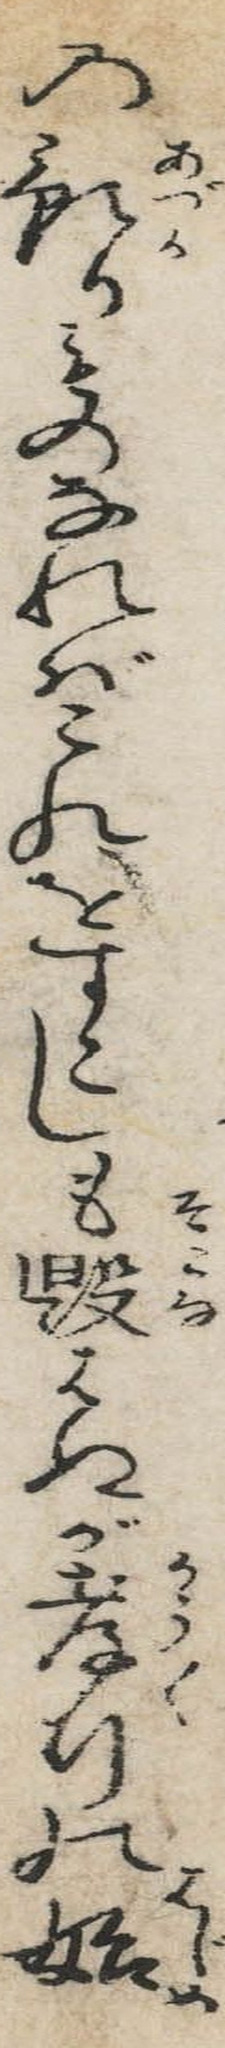の預りものなればこれをすこしも毀はぬが孝行の始
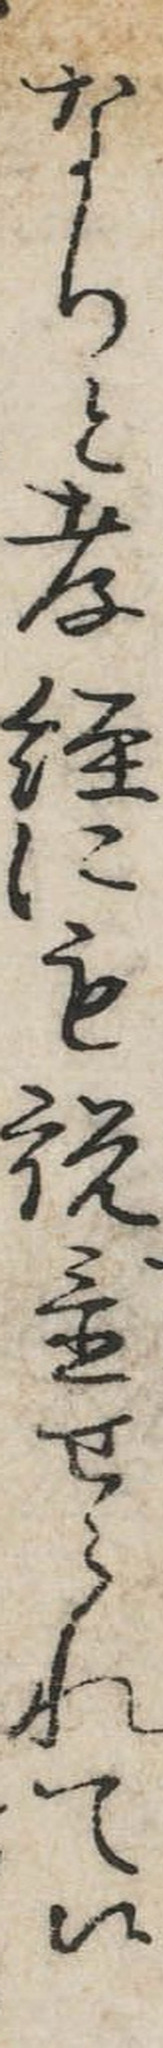なりと孝経にも説置せられて候
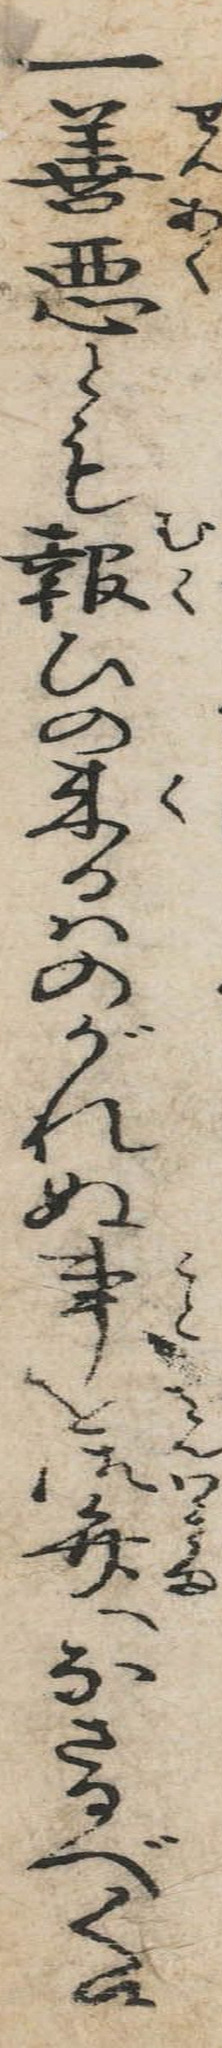一善悪とも報ひ来るはのがれぬ事を御弁へなさるべく候

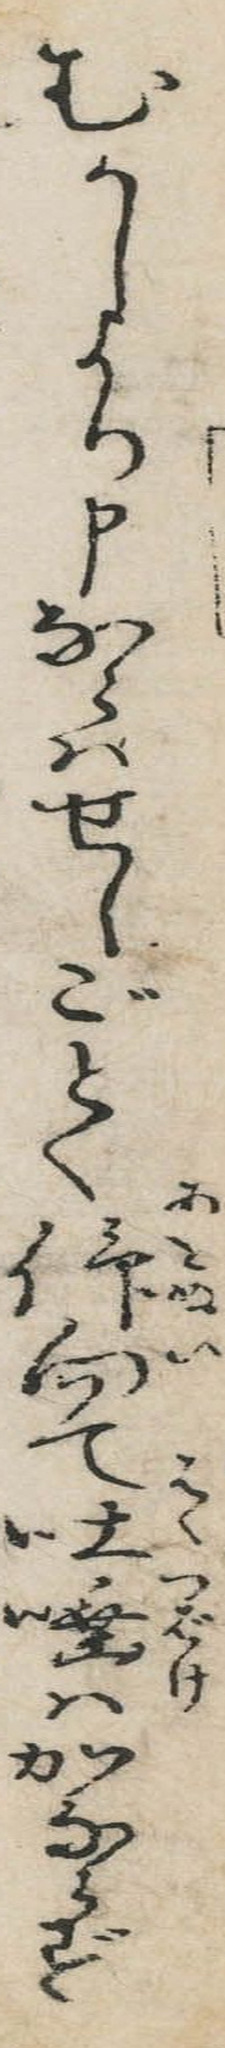むかしより申ならはせしごとく仰向て吐唾はかならず
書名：前訓
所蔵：東京学芸大学附属図書館
